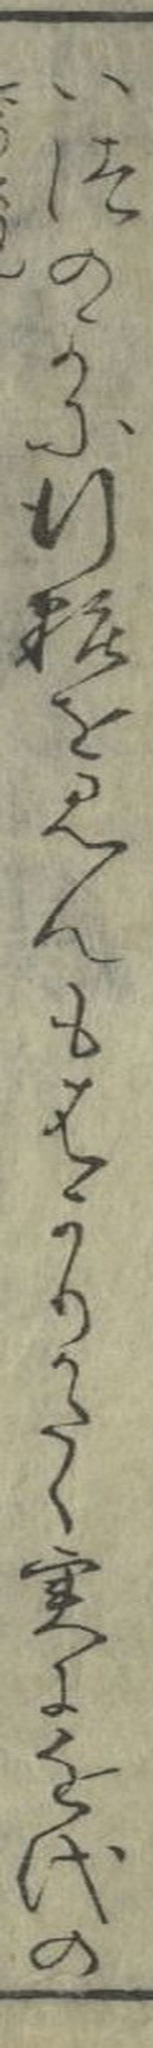いつのよに行粧を見んもはかりかたく実に近代の
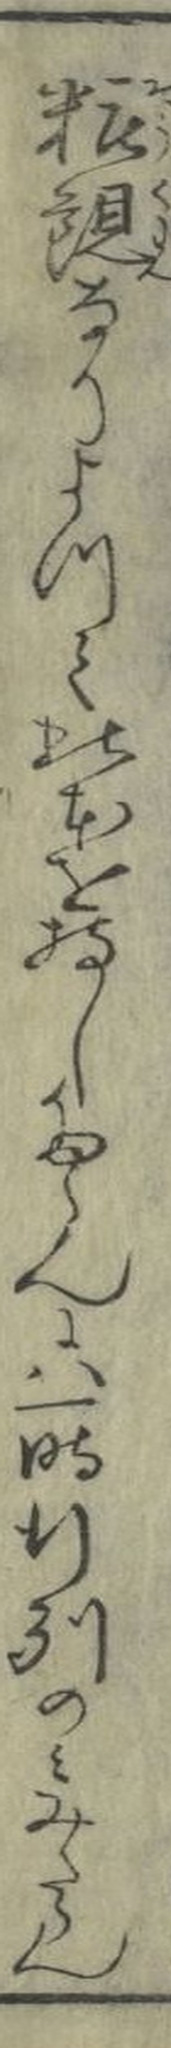粧観なりよつて此本を持したらんには一時行列のみみたらん
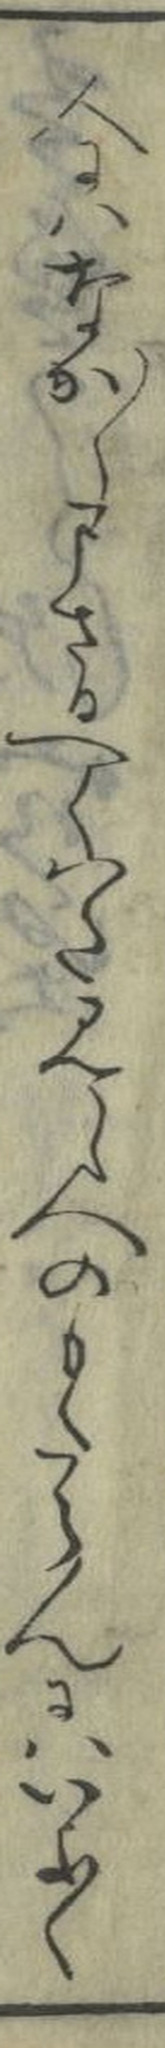人にはなか〳〵まさるへくはた見し人のもたらんにはいよ〳〵
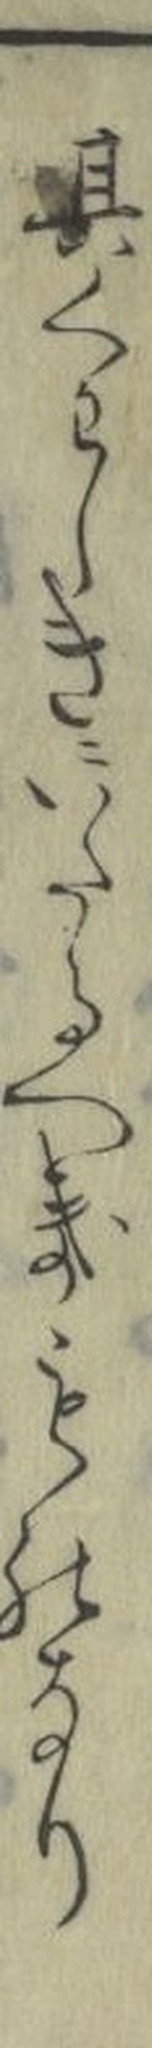其くわしきにいたるへきものなり
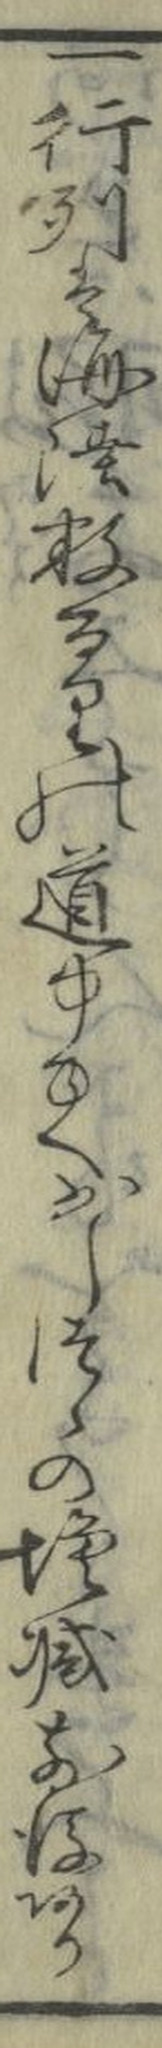一行列は海陸数百里の道中ゆへ少しつゝの増減前後あり
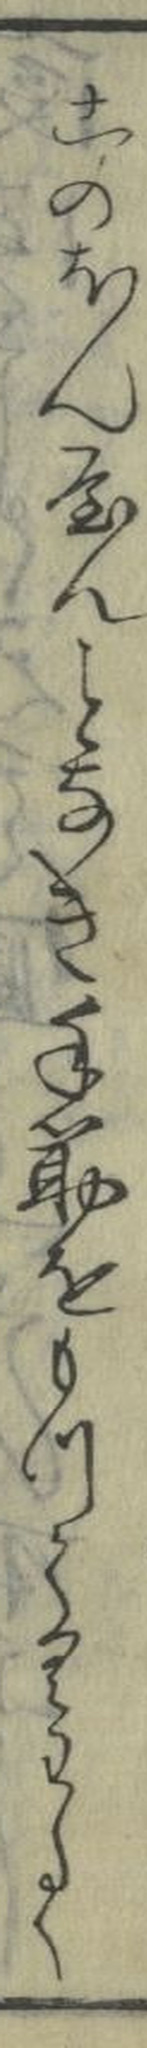このほんやんことなき手筋をもつてくわしく
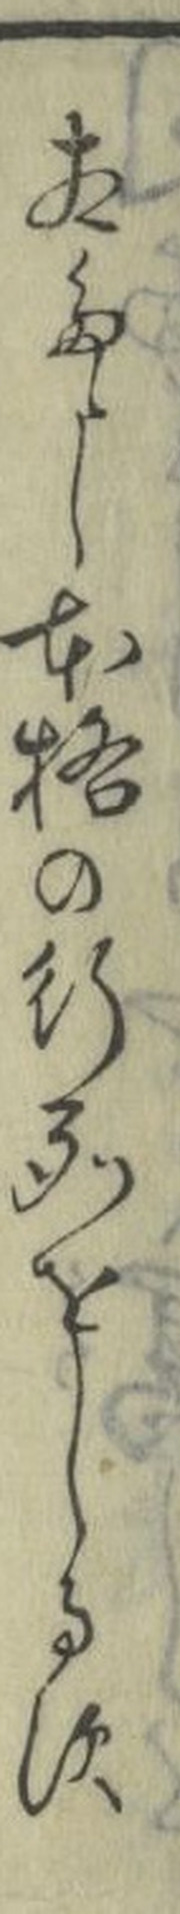相たゝし本格の行列をしるす
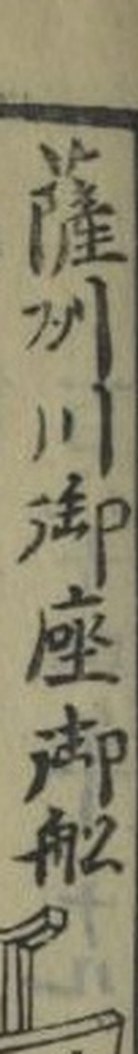薩州川御座御船
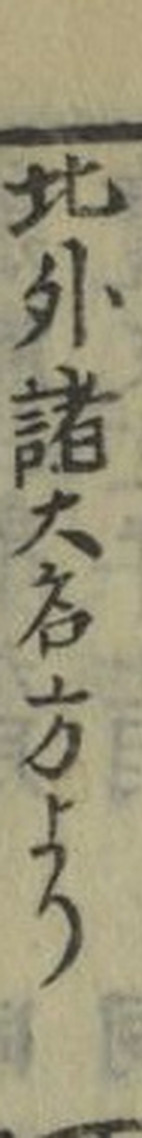此他諸大名方より
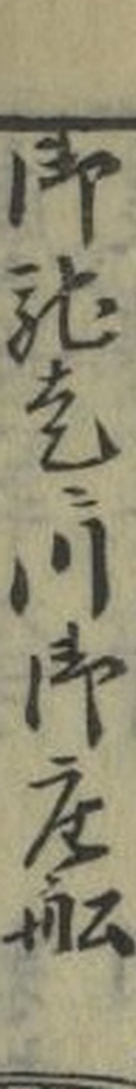御馳走に川御座船
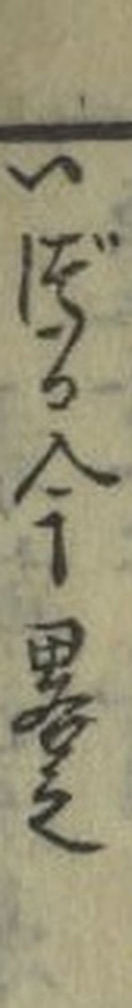いづる今略之

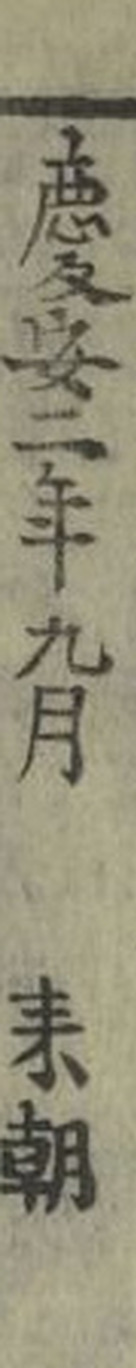慶安二年九月来朝
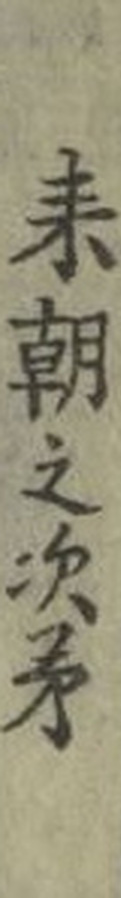来朝之次第
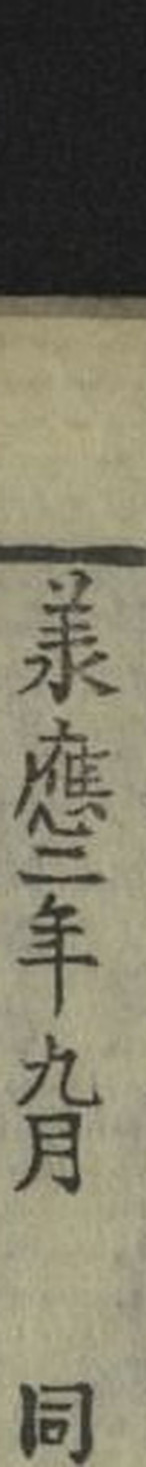承應二年九月同
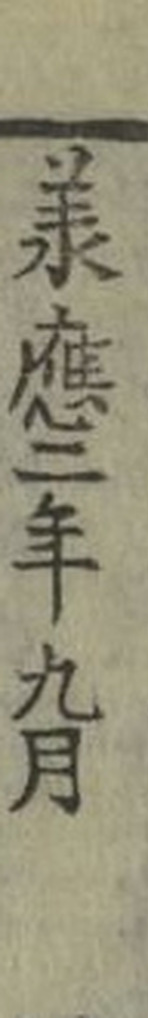承應二年九月同
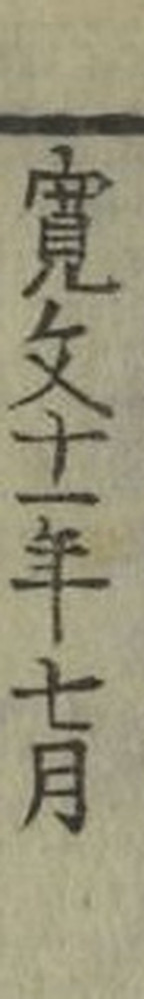寛文十一年七月同
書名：[琉球人行列記]
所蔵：University of the Ryukyus Library
